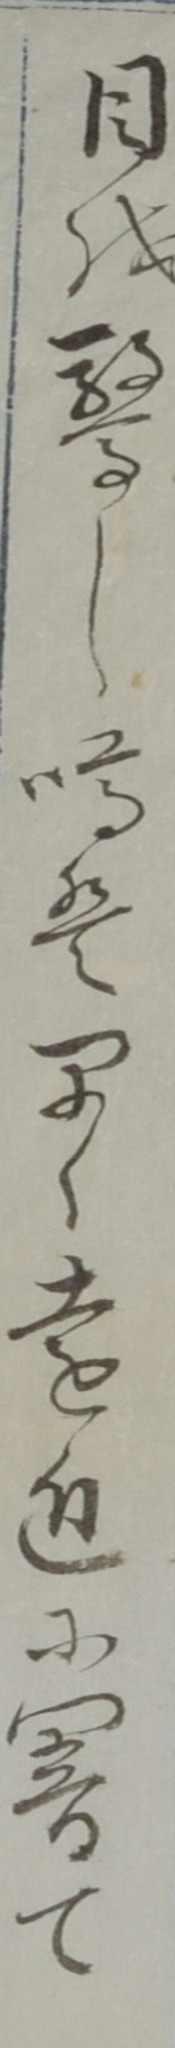目を驚し噂は早く遠近に響て
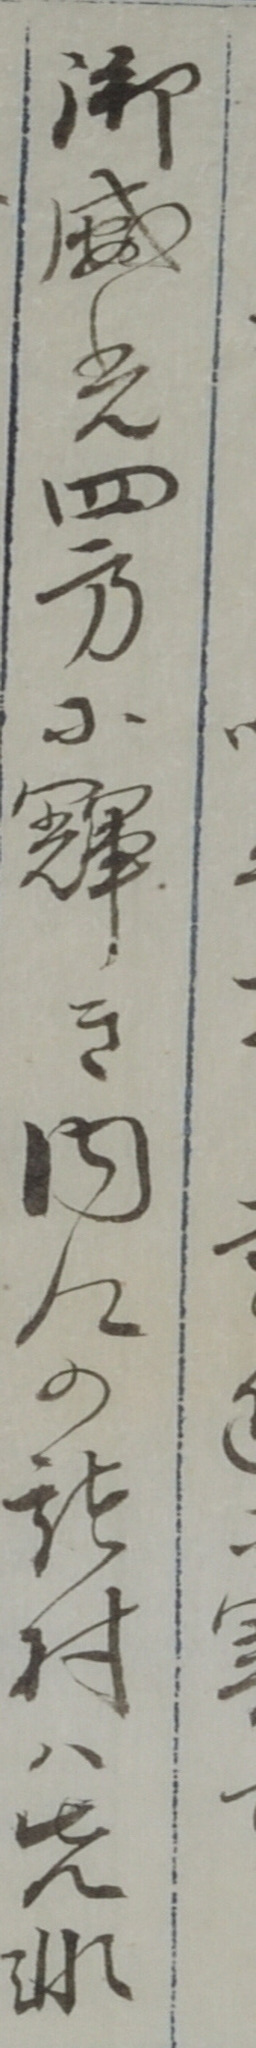御威光四方に輝き内郷の諸村は先非
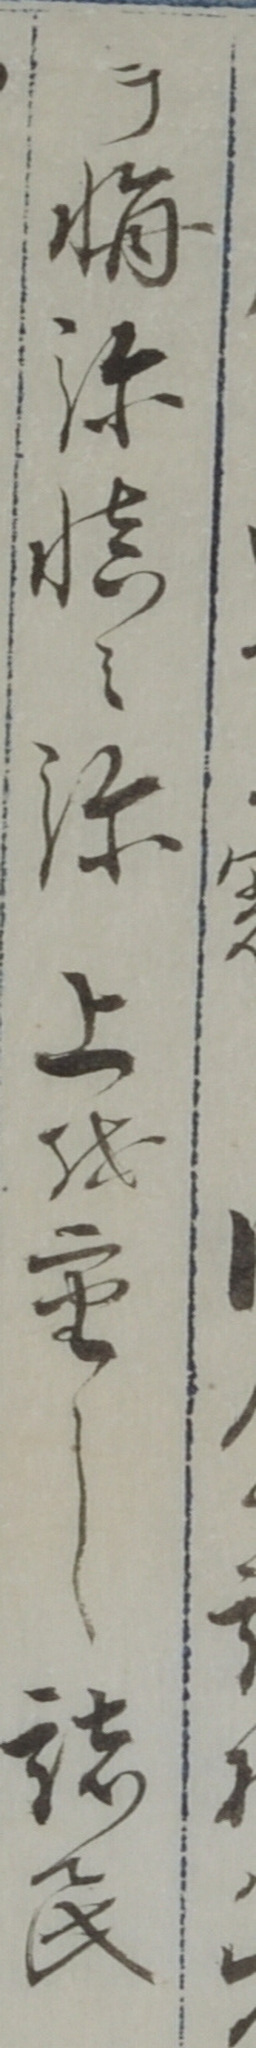ヲ悔弥慎み弥上を重し諸民
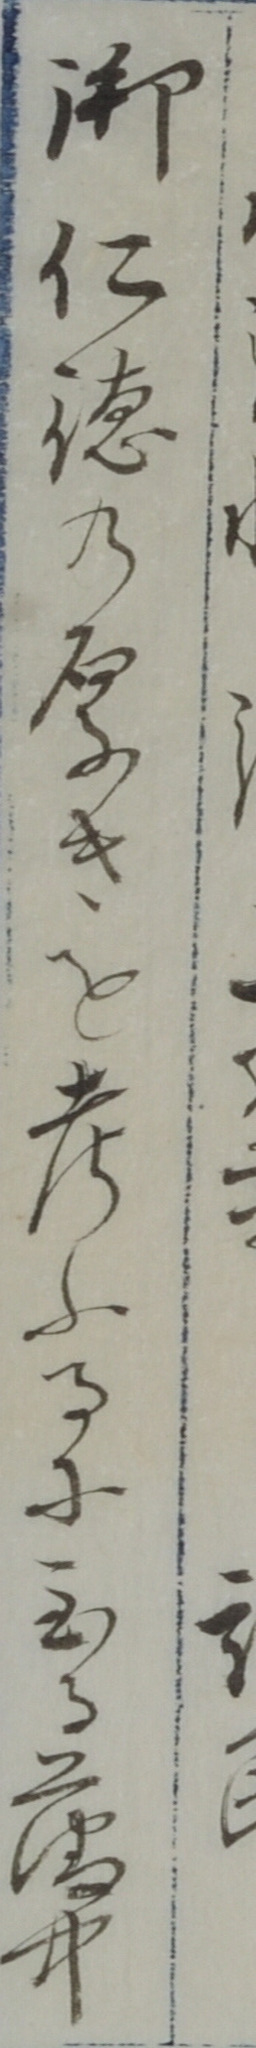御仁徳の厚きを考ふるに至る藩中
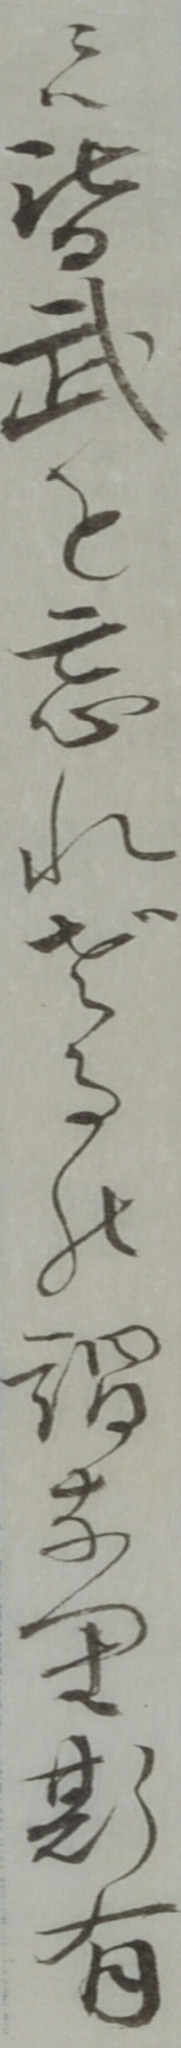にハ皆武を忘れざるの謂なり斯有
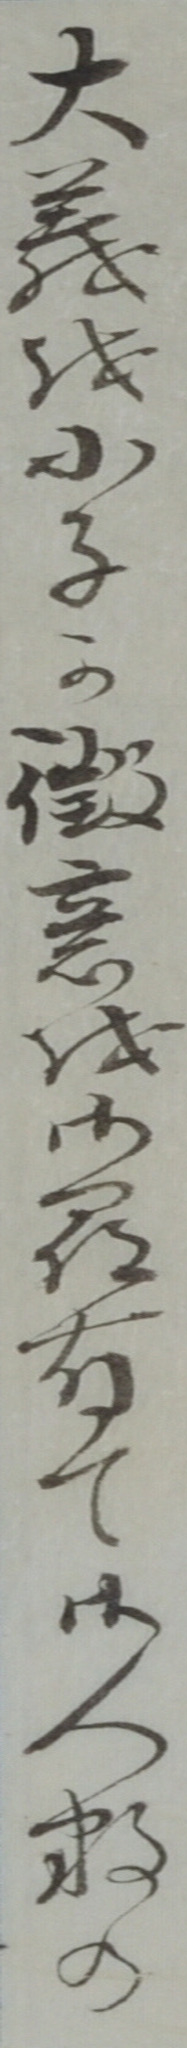大義を小子可徴意を御尋有て御人数の
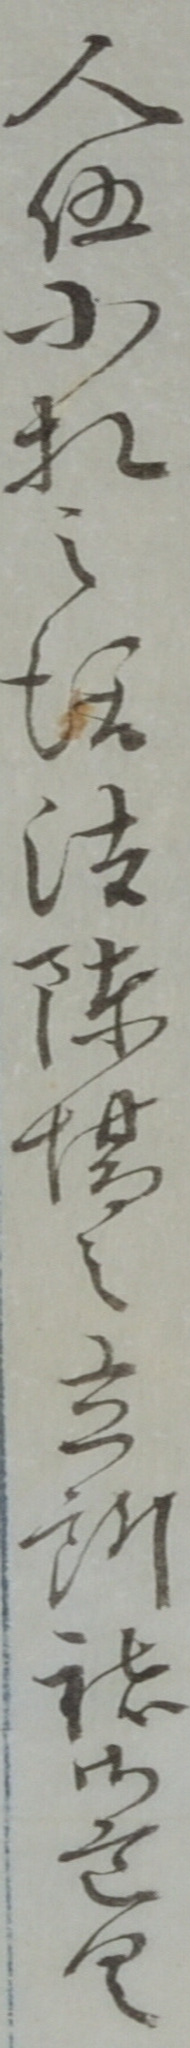人伍小札之趣法陣場之立所諸御道具
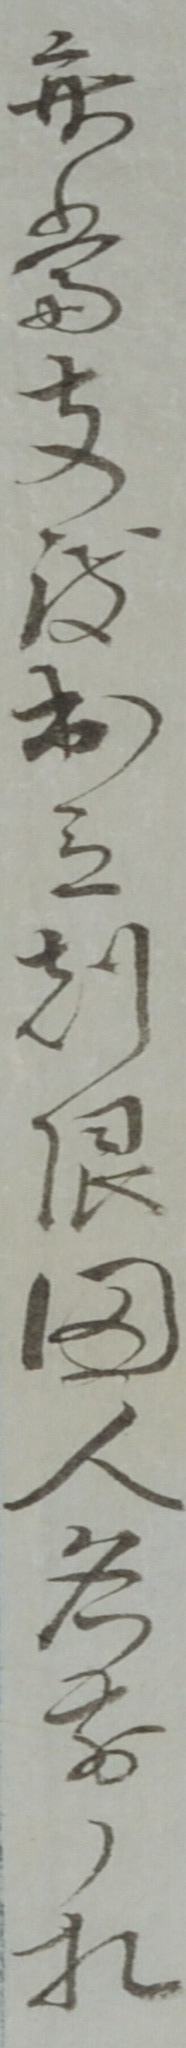弁当支度出立刻限囚人名前ノ札
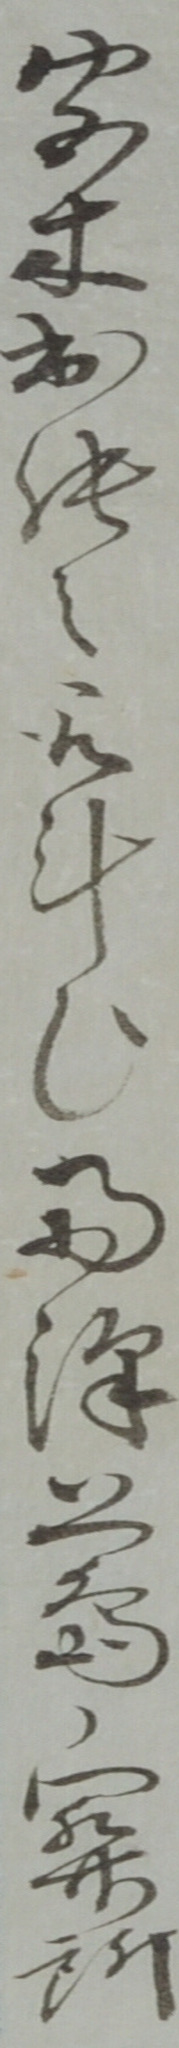宮木出張之取計ひ雨沢上島ノ関所
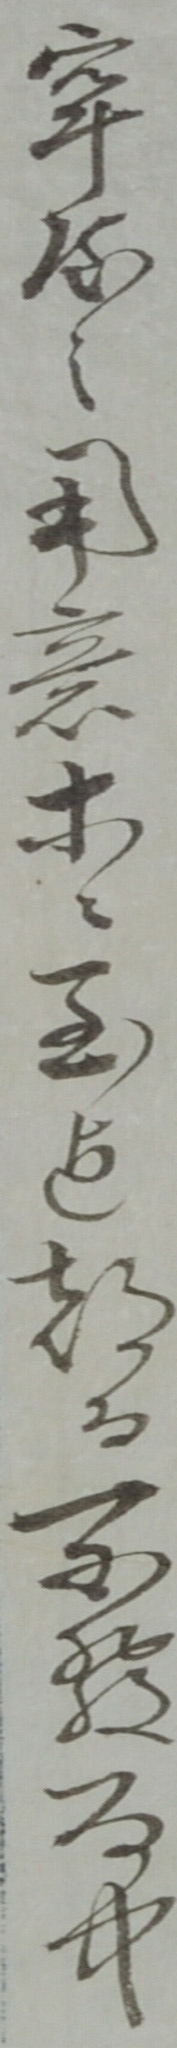牢屋之用意等ニ至迄都而百発百中
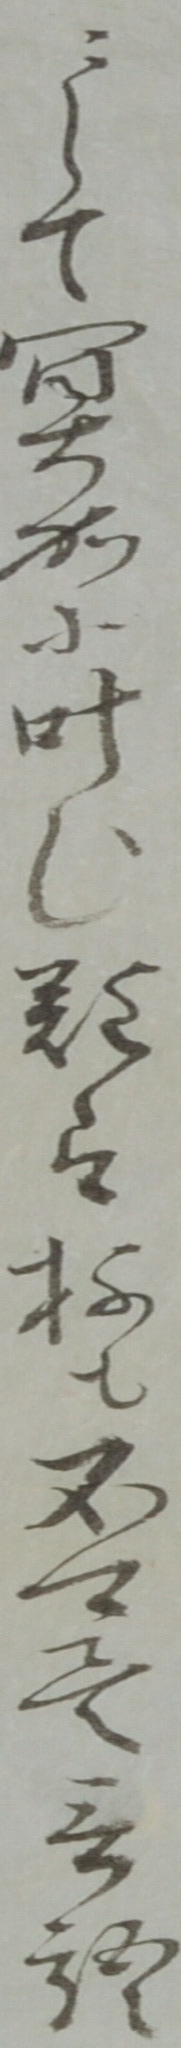にして冥加に叶ひ難有抔も不可尽言語
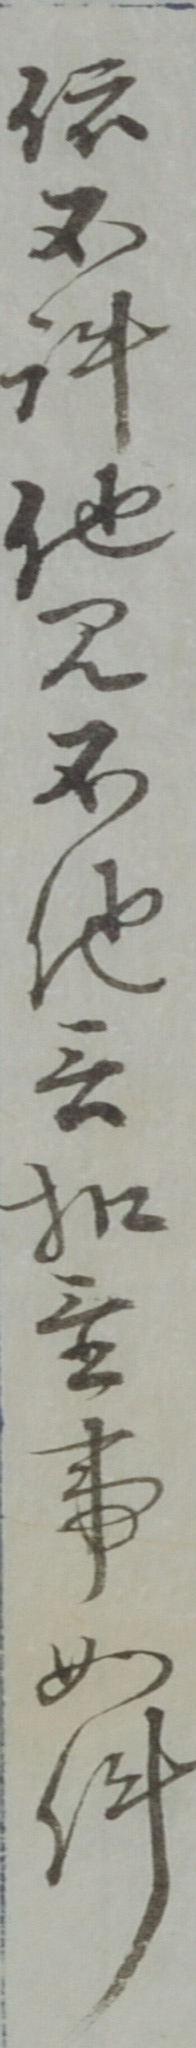依不許他見不他言扣置事如件
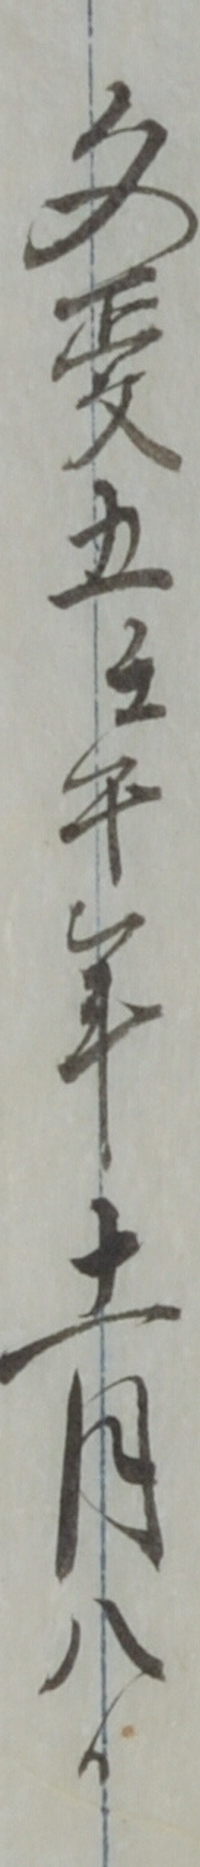文政五壬午年十一月八日
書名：高遠領洗馬騒動一件抜書
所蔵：伊那市立高遠町図書館・合同会社AMANE
